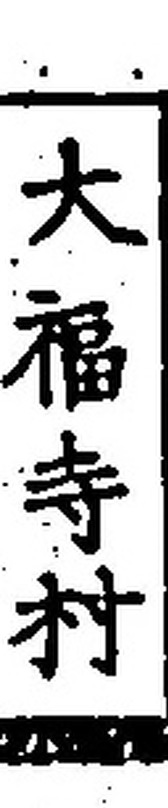大福寺村
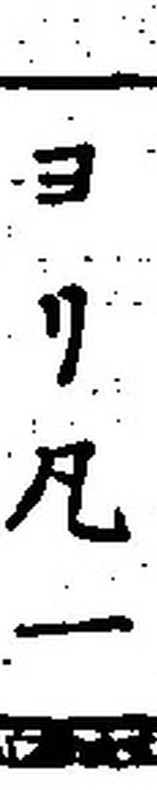ヨリ凡一
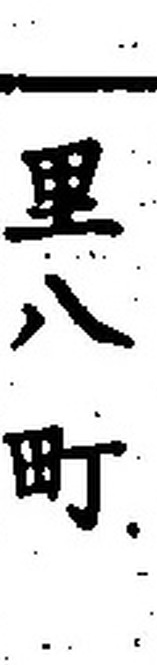里八町
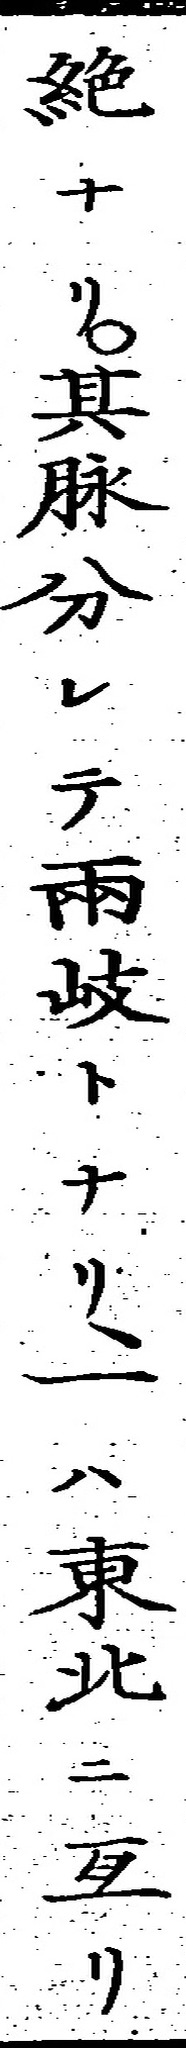絶ナリ。其脈分レテ両岐トナリ、一ハ東北ニ亙リ
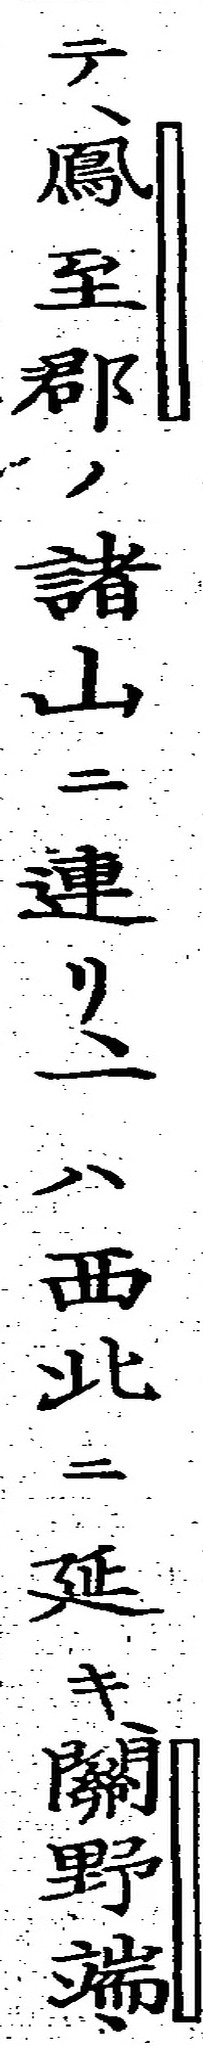テ、鳳至郡ノ諸山ニ連リ、一ハ西北ニ延キ、関野端・
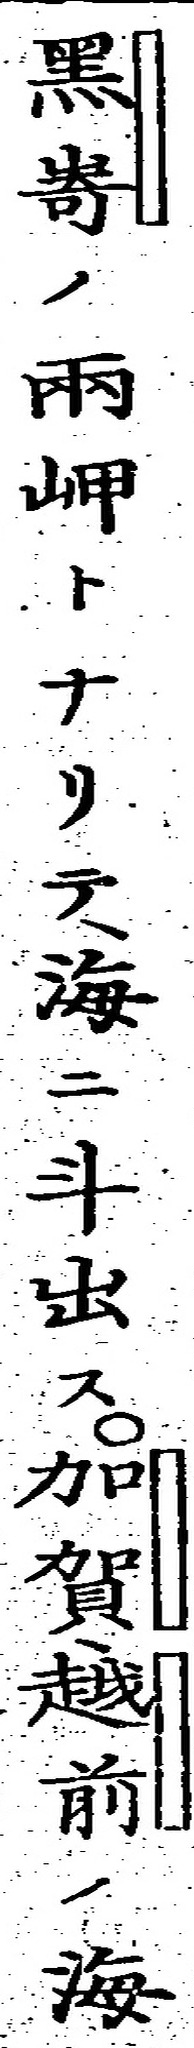黒崎ノ両岬トナリテ、海ニ斗出ス。加賀・越前ノ海
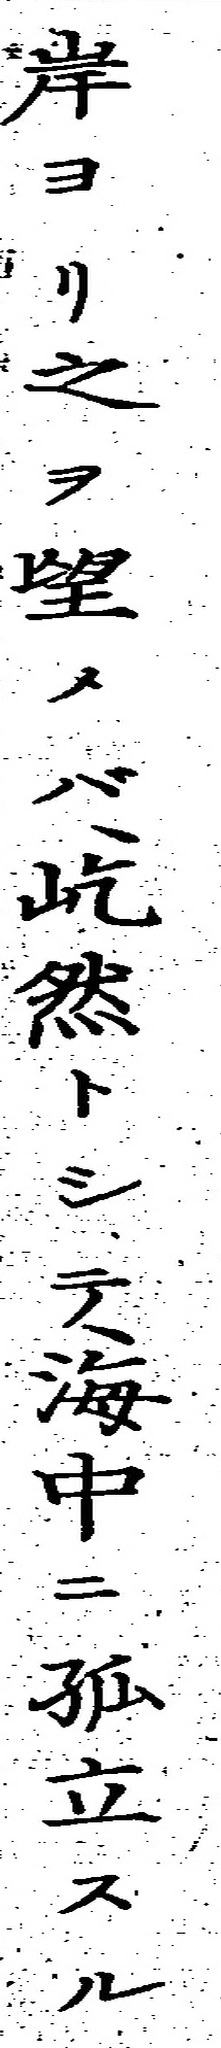岸ヨリ之ヲ望メバ、屹然トシテ、海中ニ孤立スル
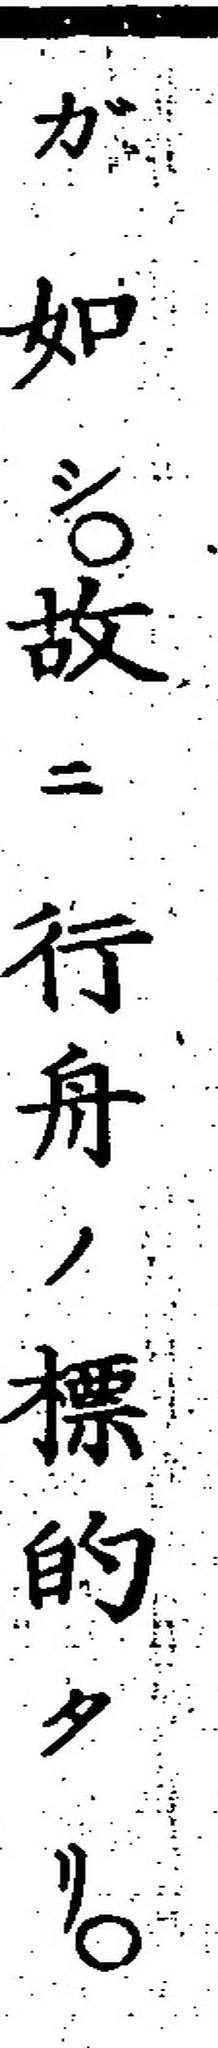ガ如シ。故ニ行舟ノ標的タリ。
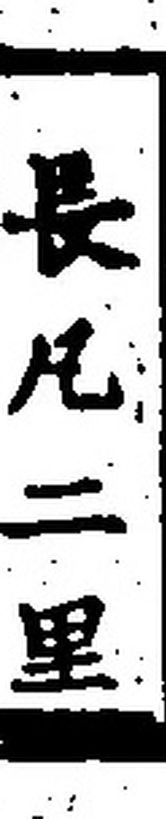長凡二里
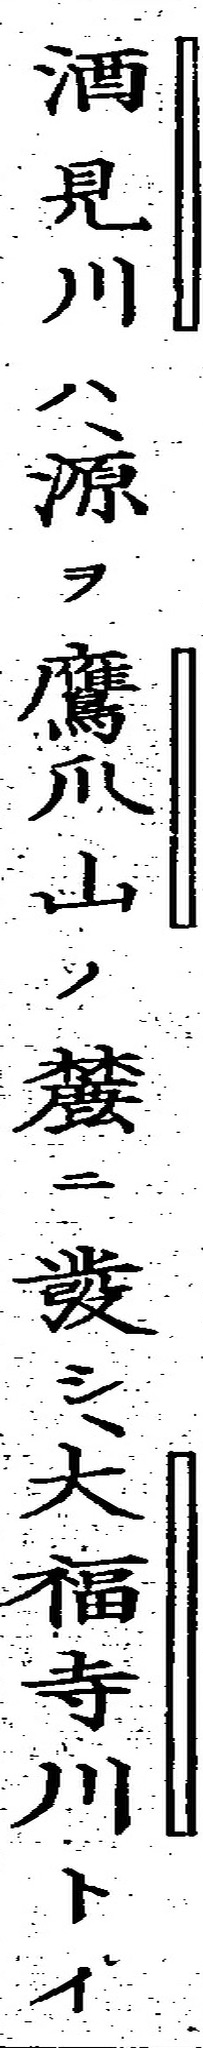酒見川ハ、源ヲ鷹爪山ノ麓ニ発シ、大福寺川トイ
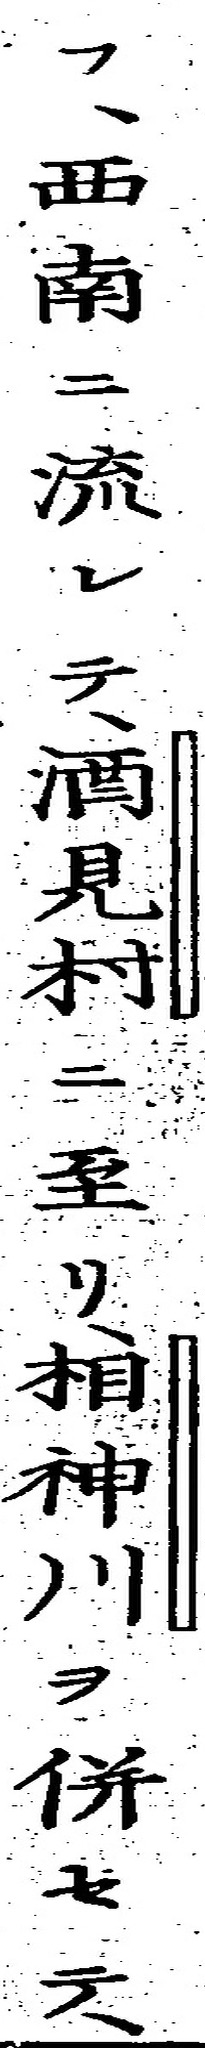フ、西南ニ流レテ、酒見村ニ至リ、相神川ヲ併セテ、
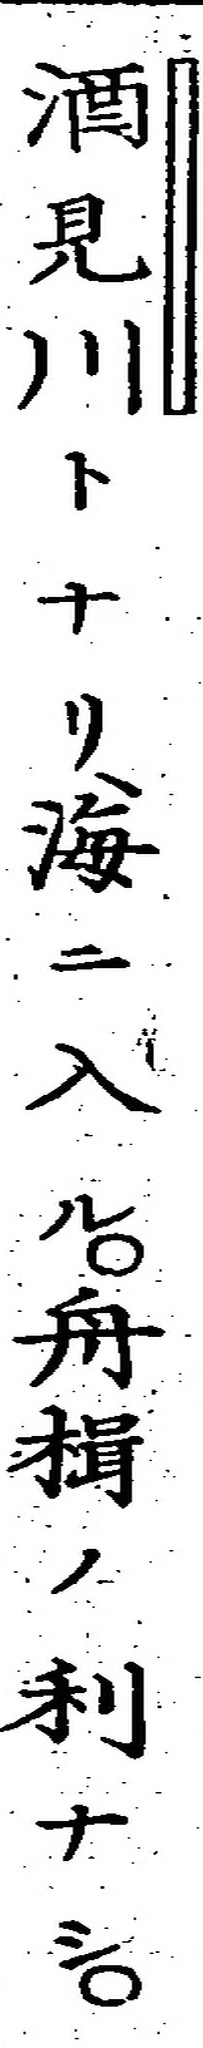酒見川トナリ、海ニ入ル。舟楫ノ利ナシ。
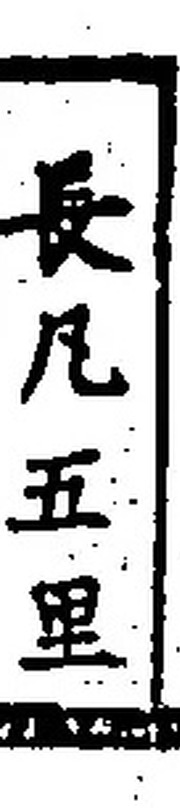長凡五里
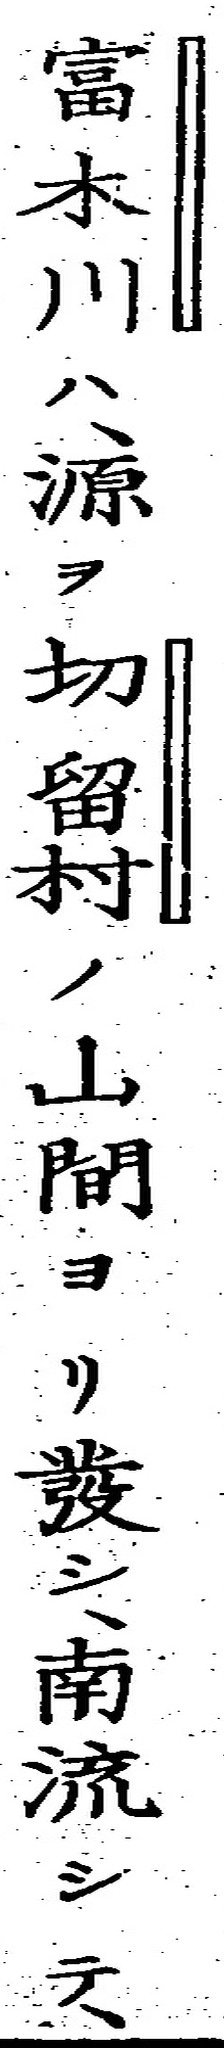富木川ハ、源ヲ切留村ノ山間ヨリ発シ、南流シテ、
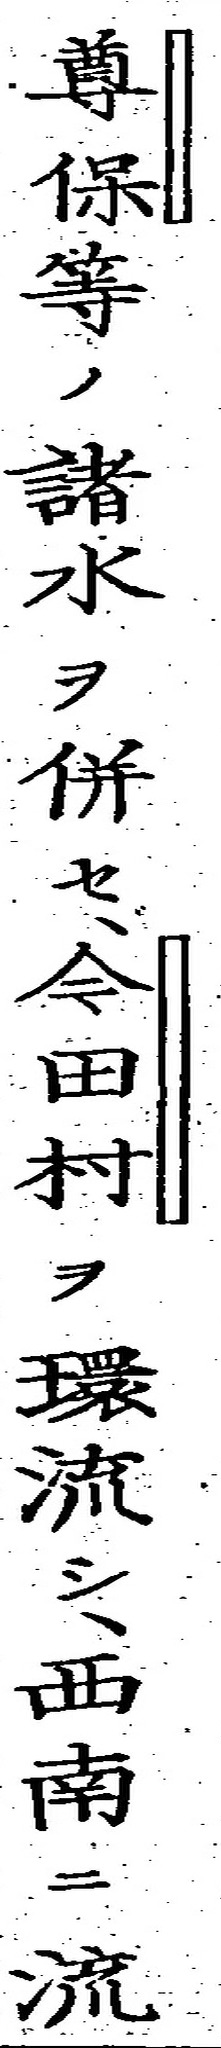尊保等ノ諸水ヲ併セ、今田村ヲ環流シ、西南ニ流
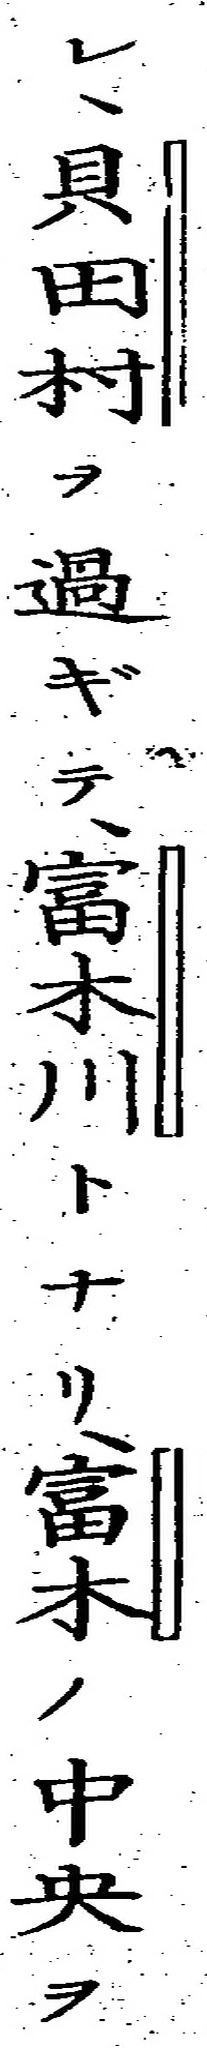レ、貝田村ヲ過ギテ、富木川トナリ、富木ノ中央ヲ
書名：能登地誌略
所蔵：国立国会図書館 National Diet Library, JAPAN
